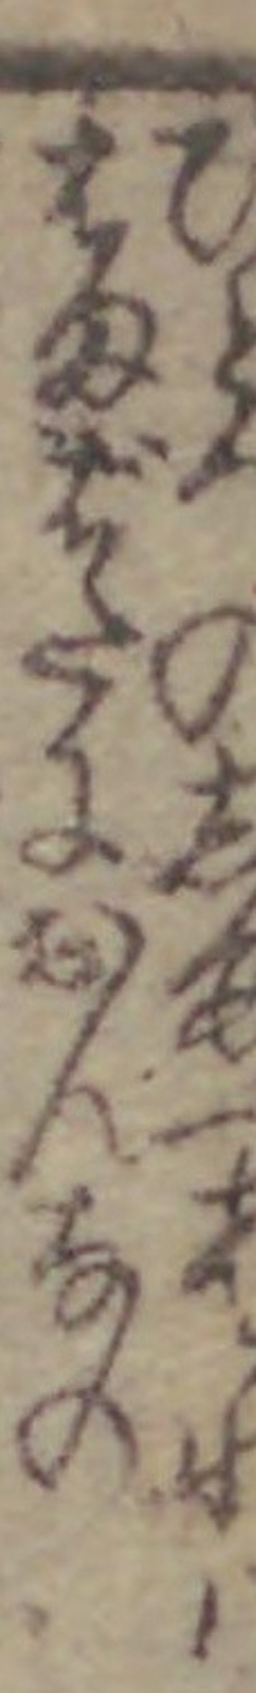はまばたにおんなの
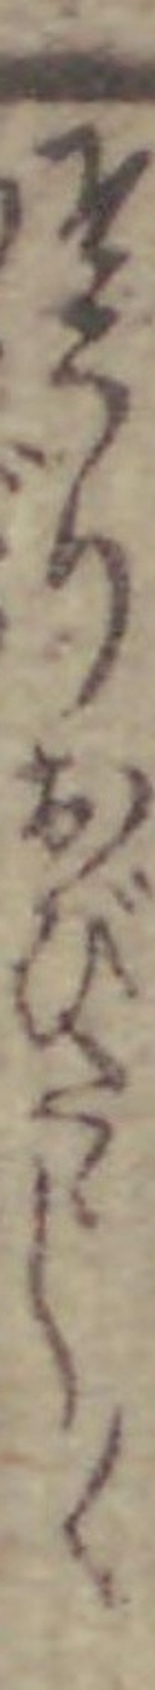そうりおびたゝしく
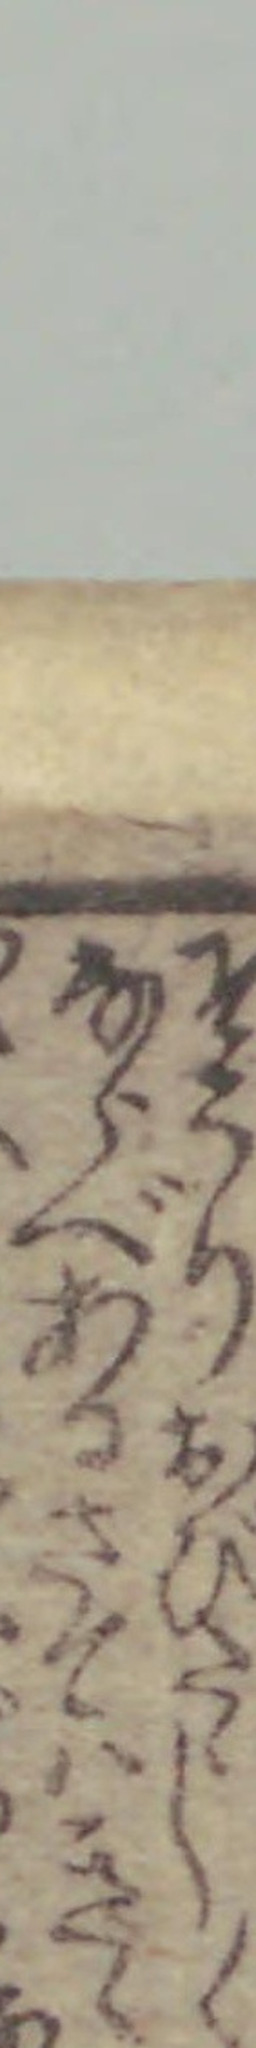ならべあるさてはきゝ
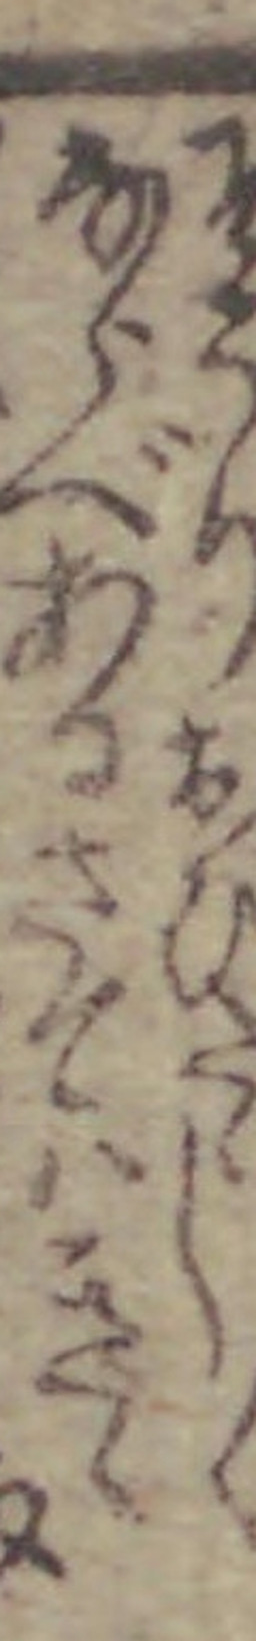ならべあるさてはきゝ
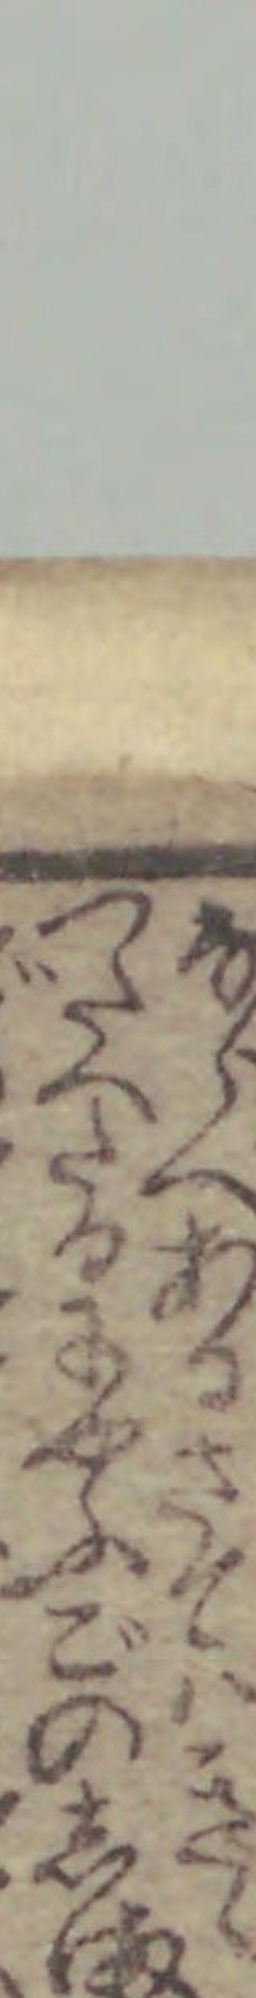つたへたるにやふごのしま
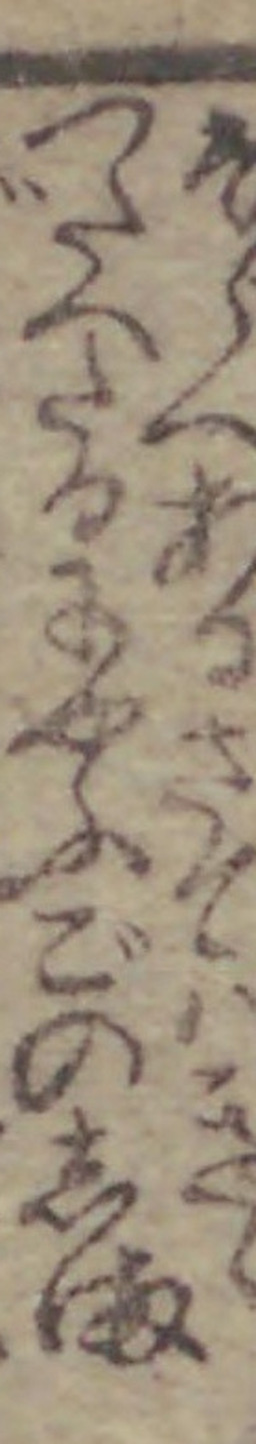つたへたるにやふごのしま
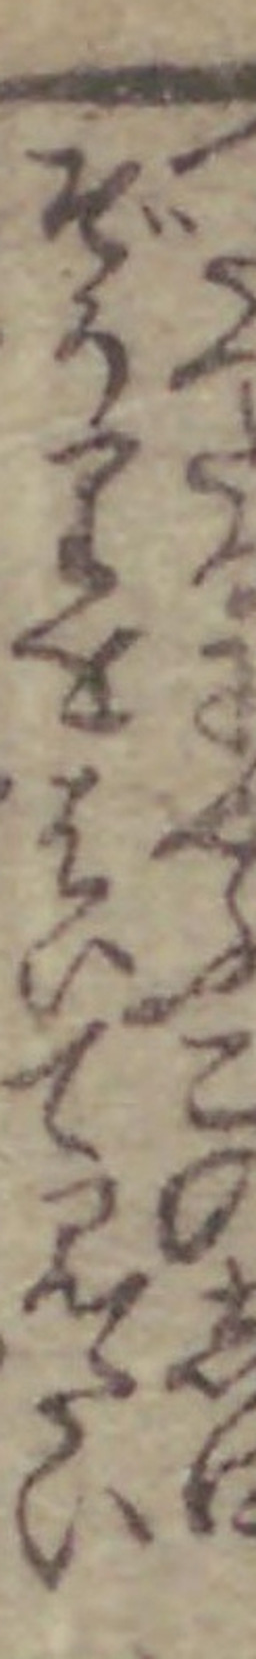ぞうりをはいてみたい
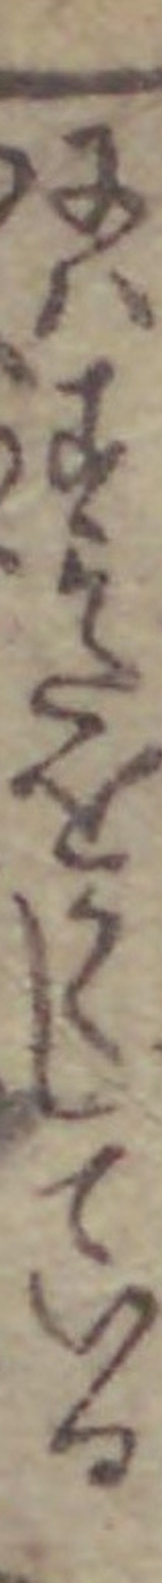にはすかたをかくしている
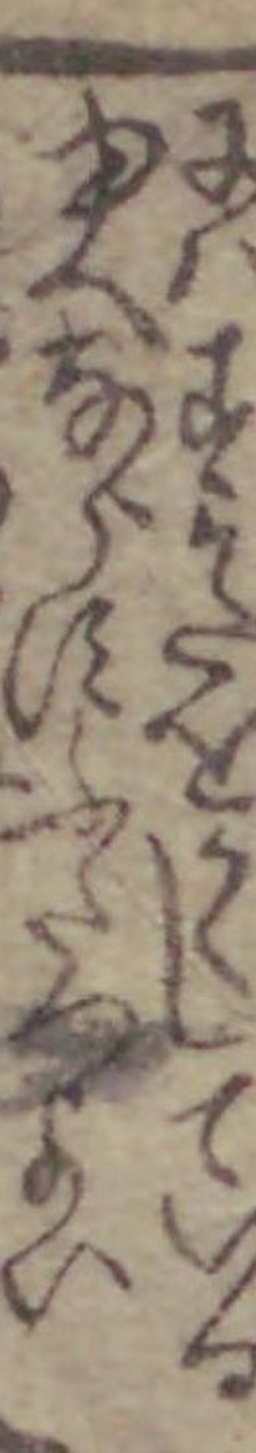ゆへならすふたつよい
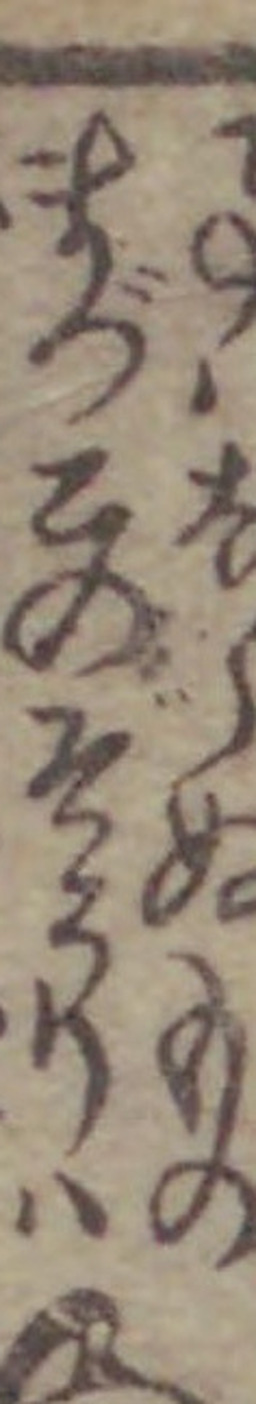まづこのそうりは
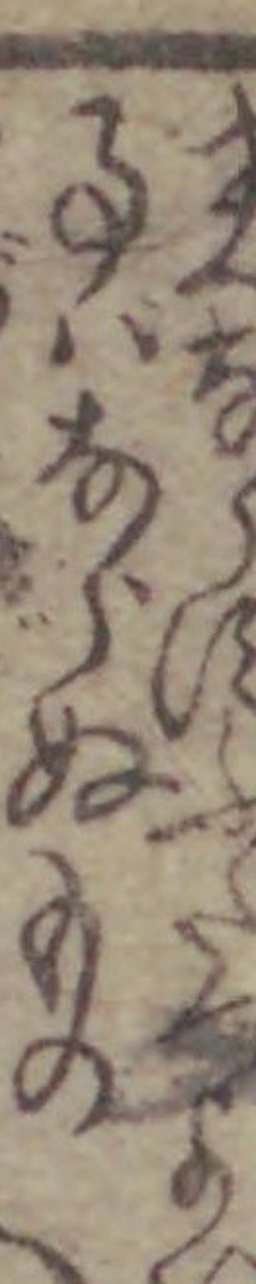事はならぬもの
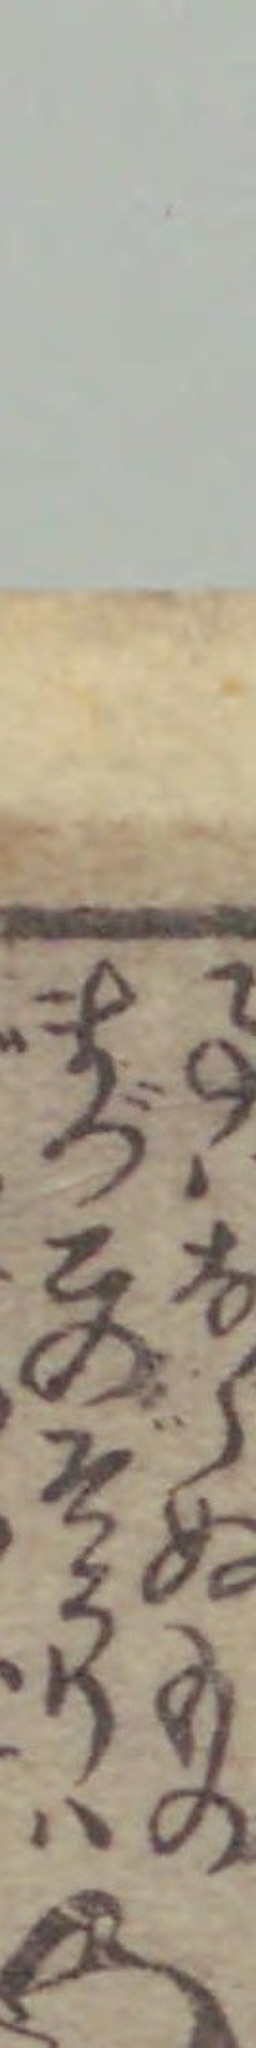まづこのそうりは
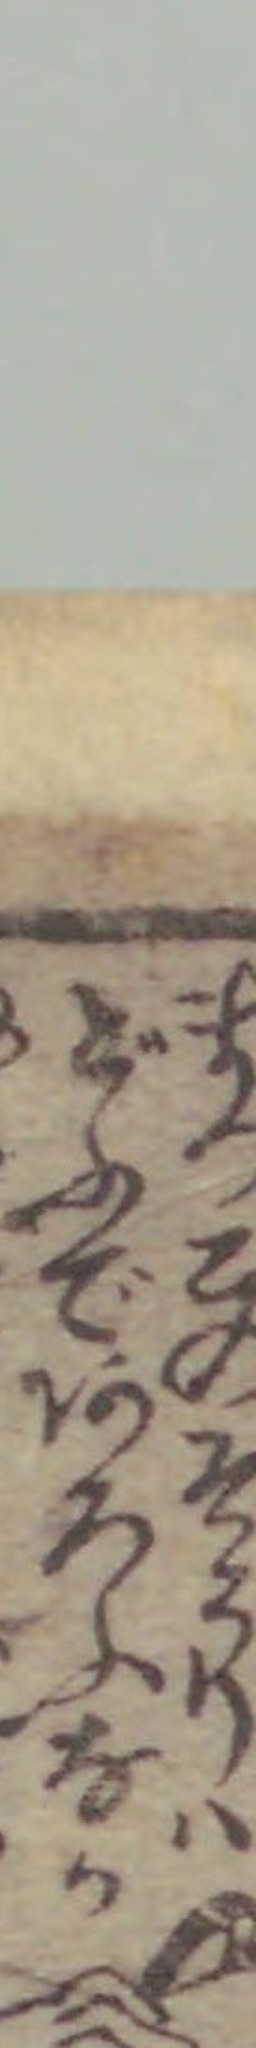どふであろふなか
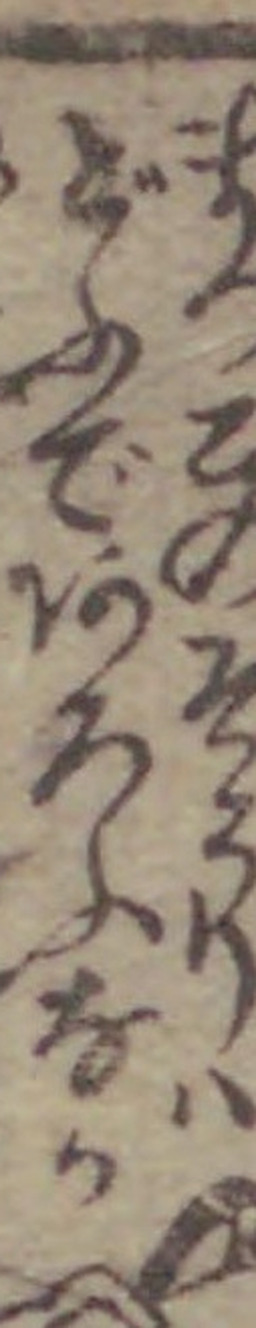どふであろふなか
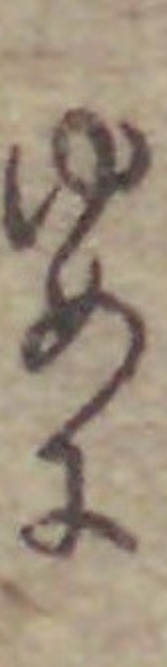ゆめに
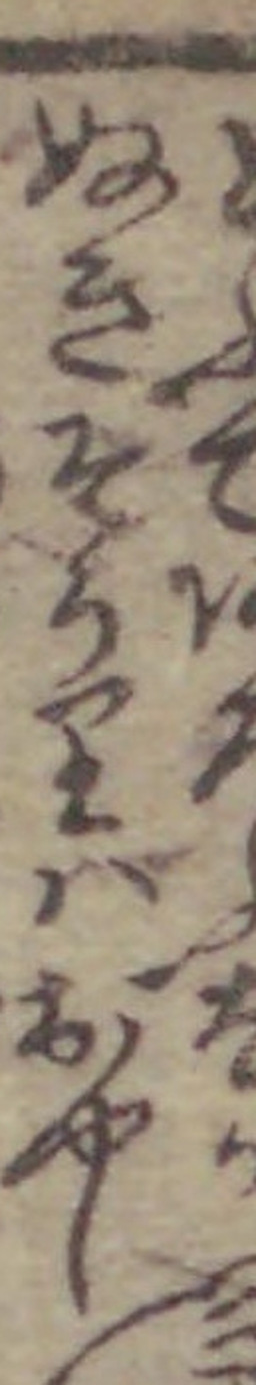ぬきそうりはおやし
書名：近頃嶋めぐり 3巻
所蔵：国立国会図書館 National Diet Library, JAPAN
